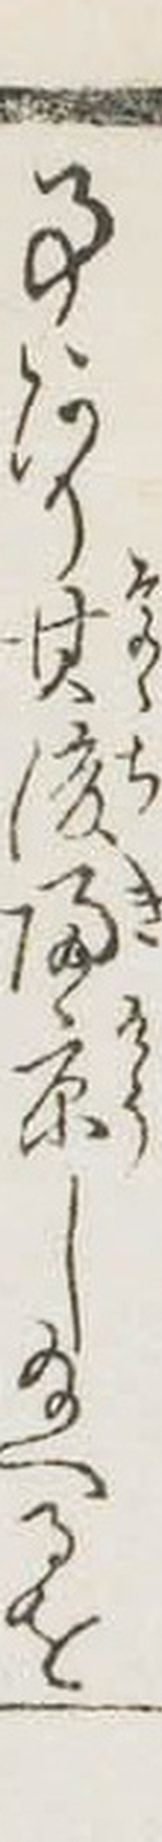事あり其後帰京し給へるを
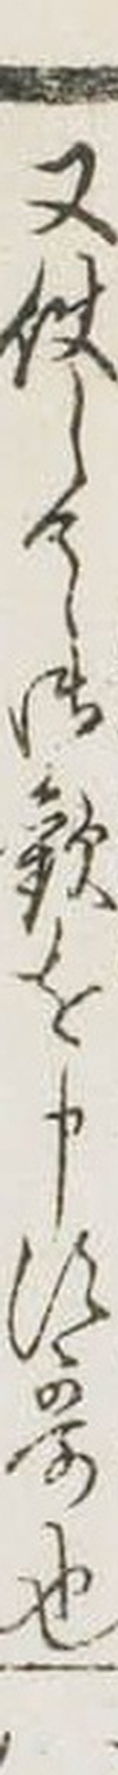又使して御歓を申す哥也
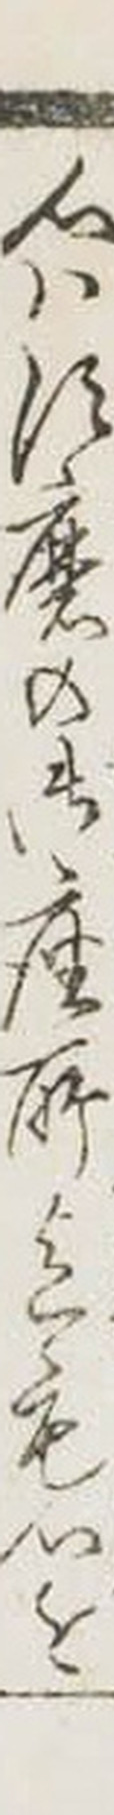心は須磨の御座所迄も心を
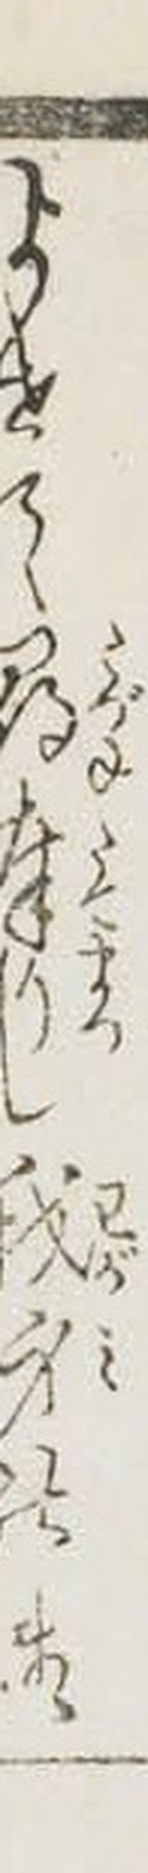よせて尋奉りし我身の御
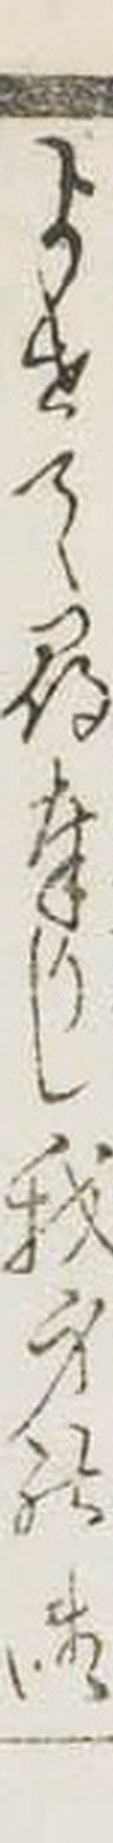よせて尋奉りし我身の御
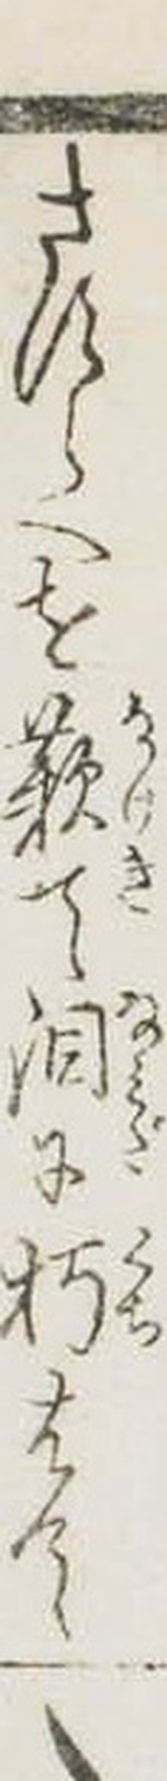さすらへを歎て泪に朽はて
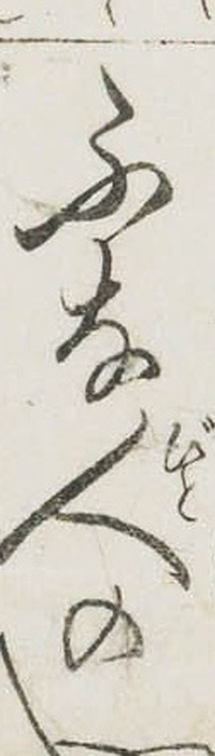ふな人の
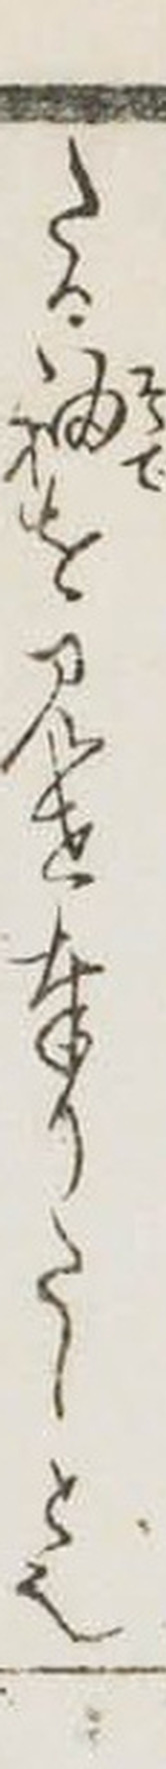たる袖を見せ奉りたしと也
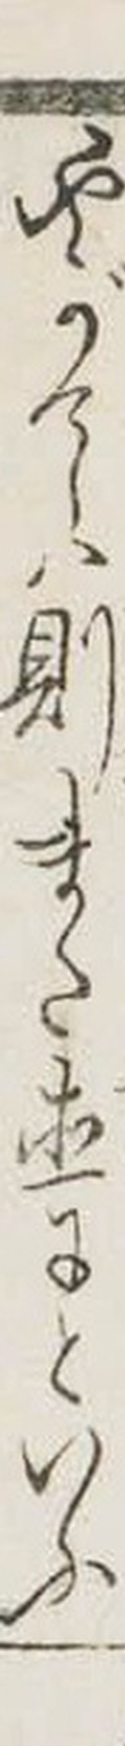やがては則また直にといふ
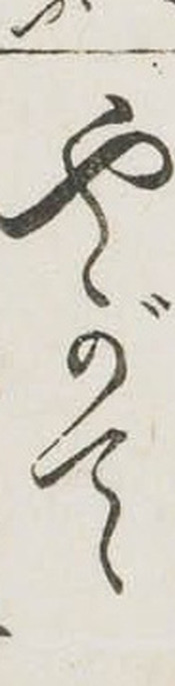やがて
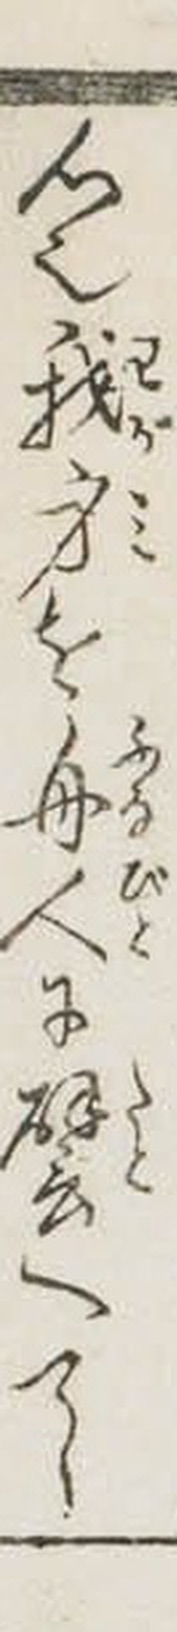心也我身を舟人に譬へて
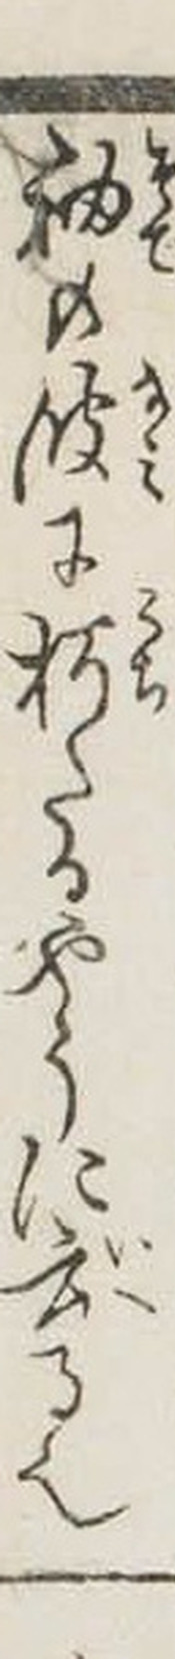袖の波に朽たるやうに云る也
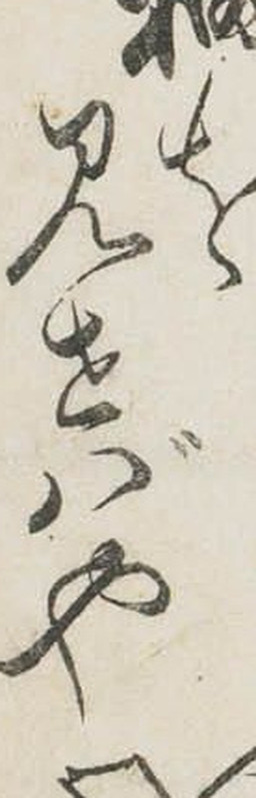見せばや

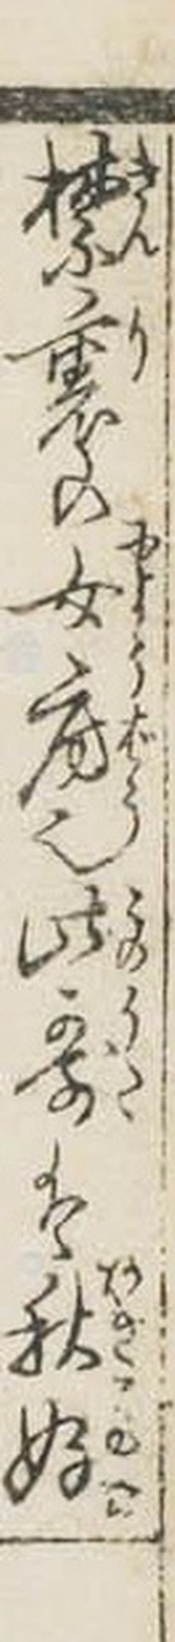禁裏の女房也此哥は秋好
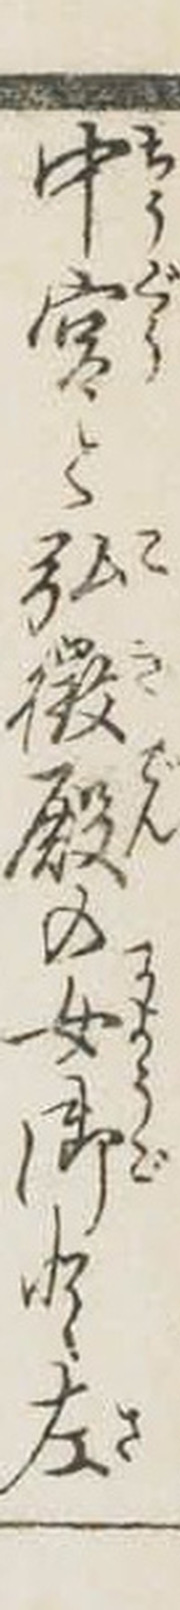中宮と弘徽殿の女御と左
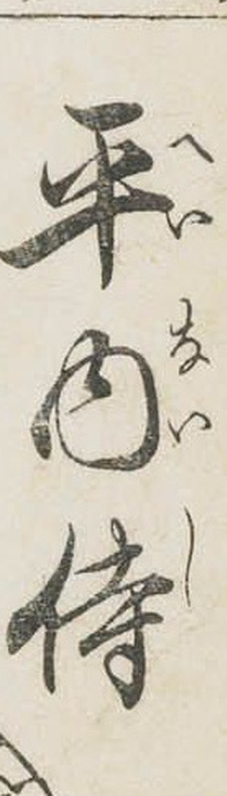平内侍
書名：源氏百人一首
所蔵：東京学芸大学教育コンテンツアーカイブ
